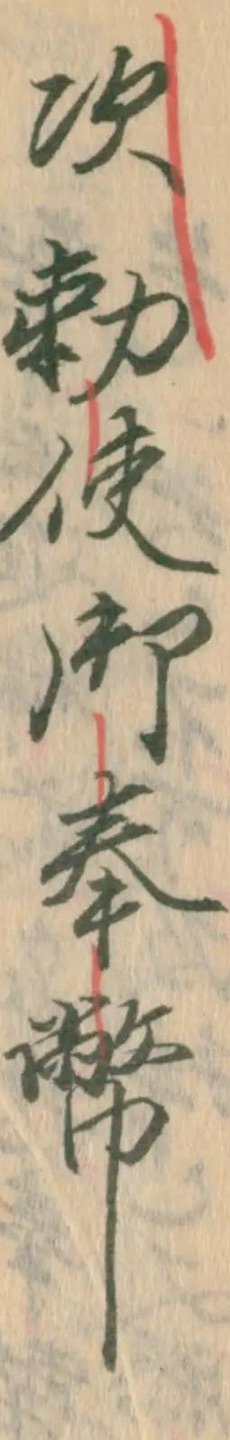次勅-使御-奉-幣

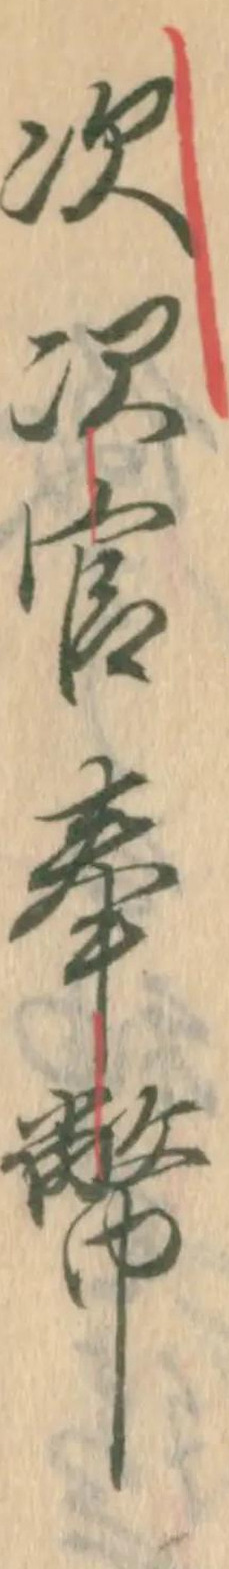次次-官奉-幣
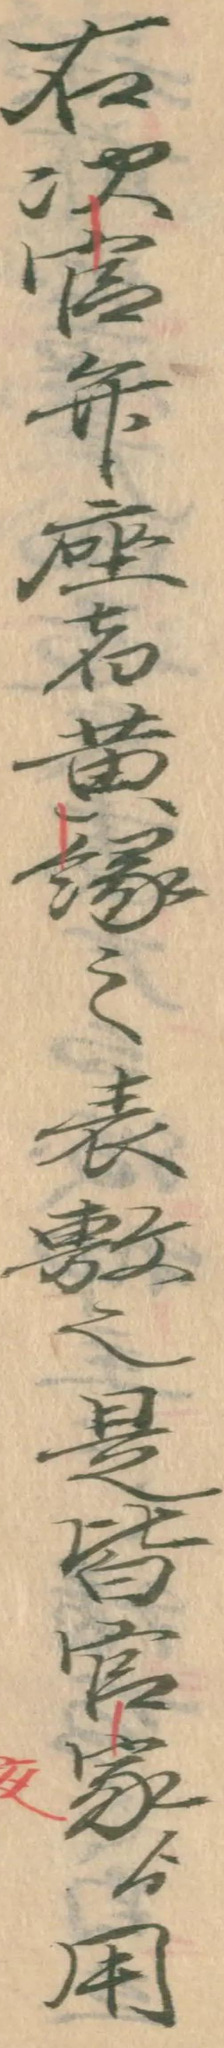右次-官弁座者黄_縁之表敷也是皆官-家ゟ用
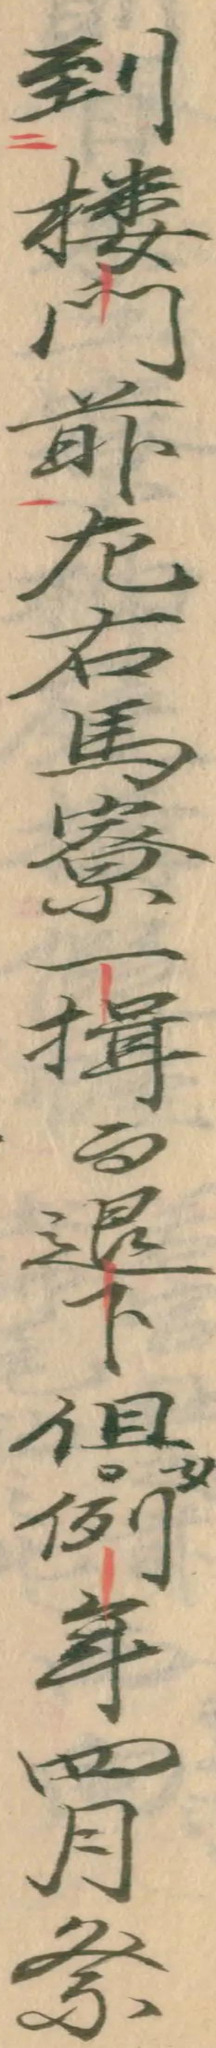到楼-門前左右馬寮一-揖而退-下但￮例-年四月祭
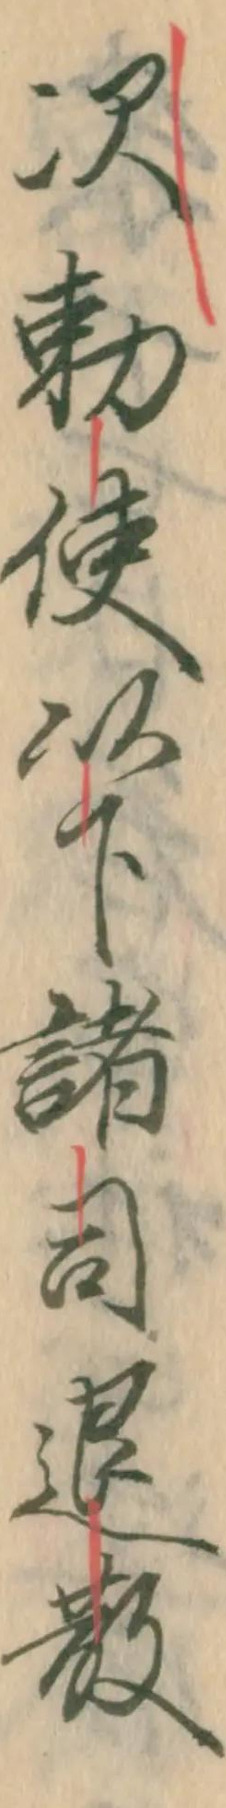次勅-使以-下諸-司退-散

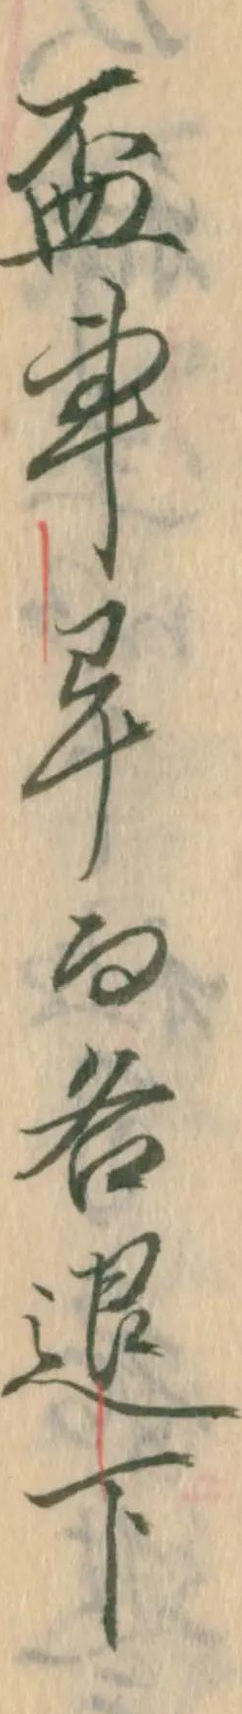盃事_畢而各退-下
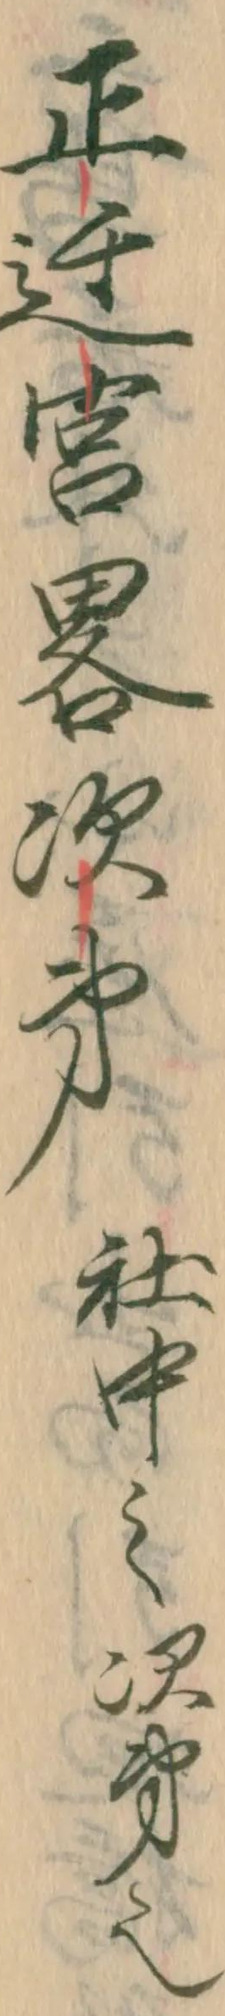正-迁-宮略次-第社中之次第也
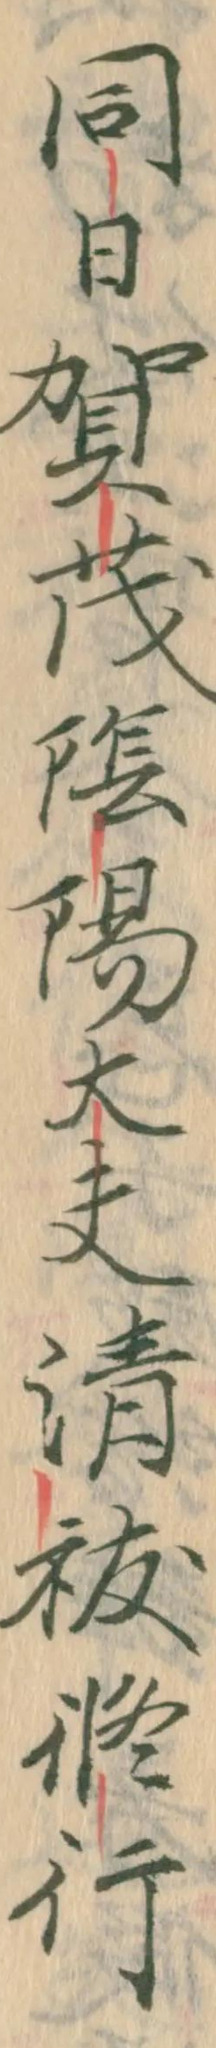同-日賀-茂陰-陽大-夫清_祓修-行

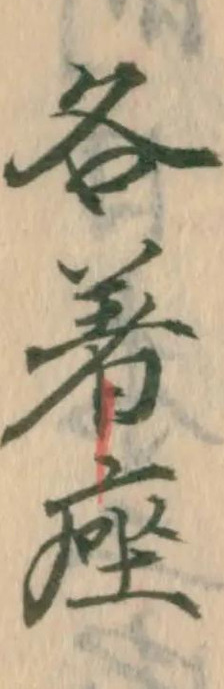各着-座
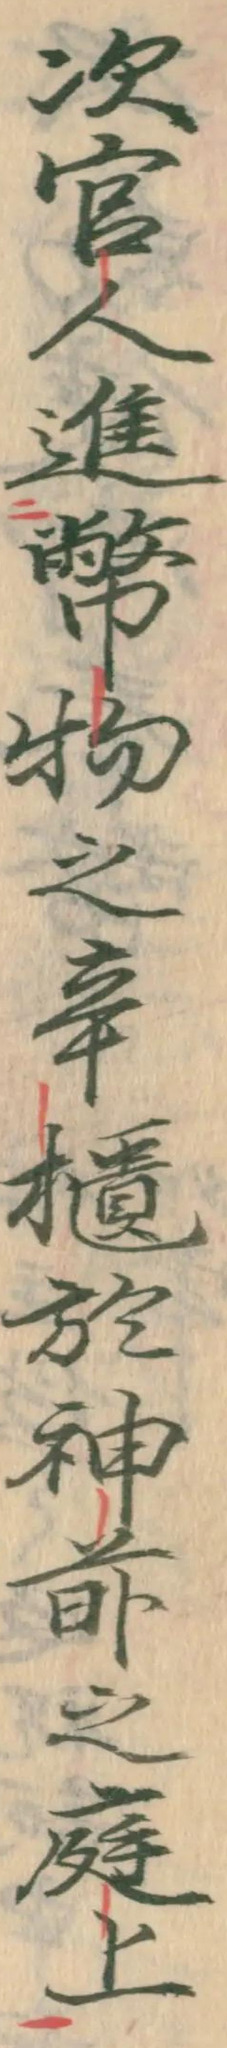次官-人進幣-物之辛_櫃於神-前之庭-上

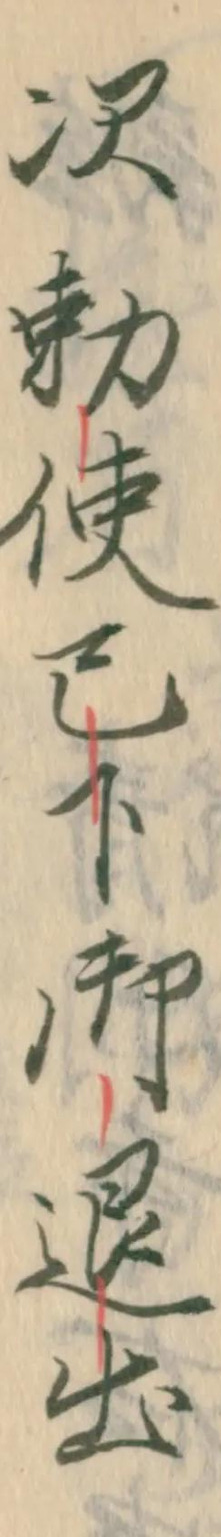次勅-使已-下御-退-出

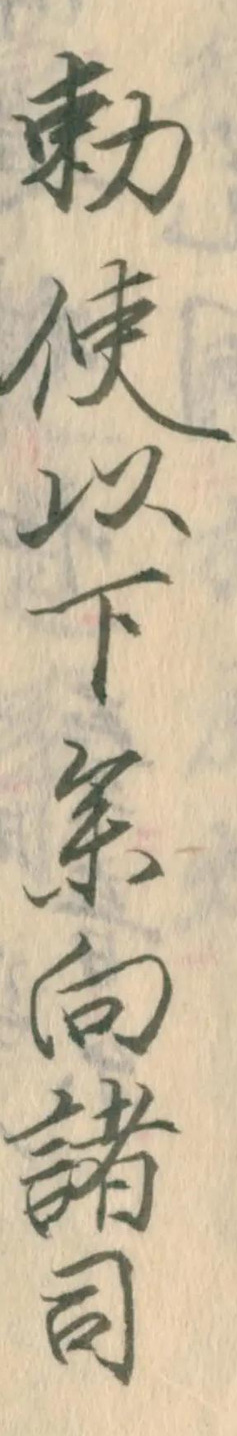勅使以下参向諸司
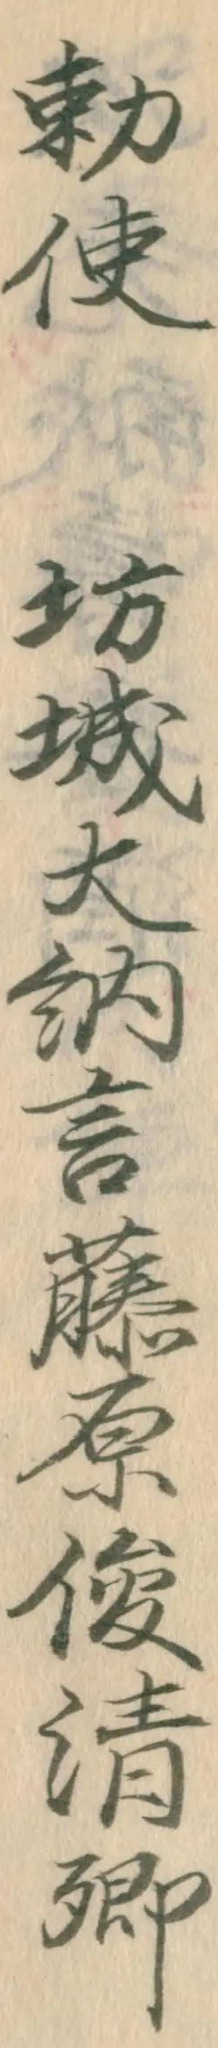勅使坊城大納言藤原俊清卿
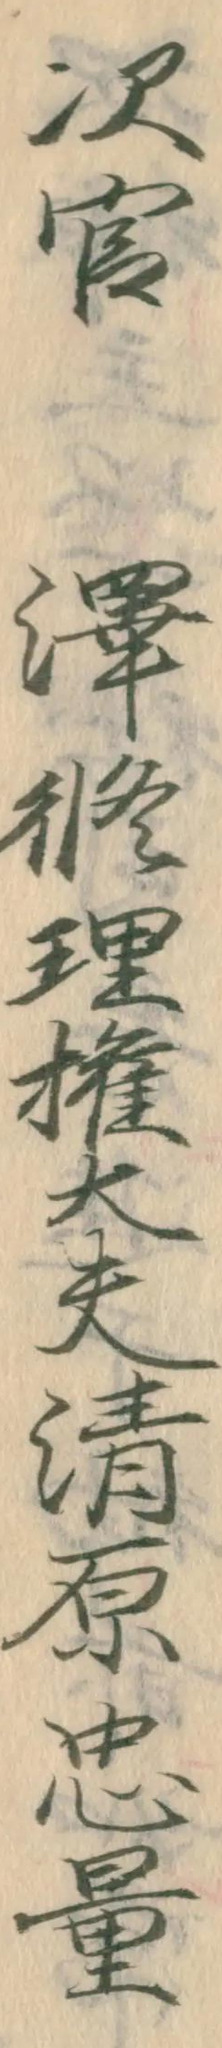次官澤修理権大夫清原忠量
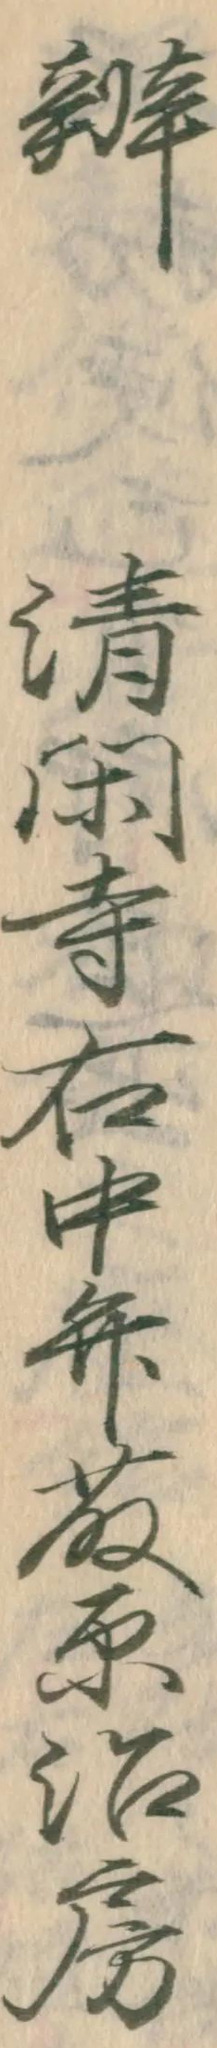弁清閑寺右中弁藤原治房
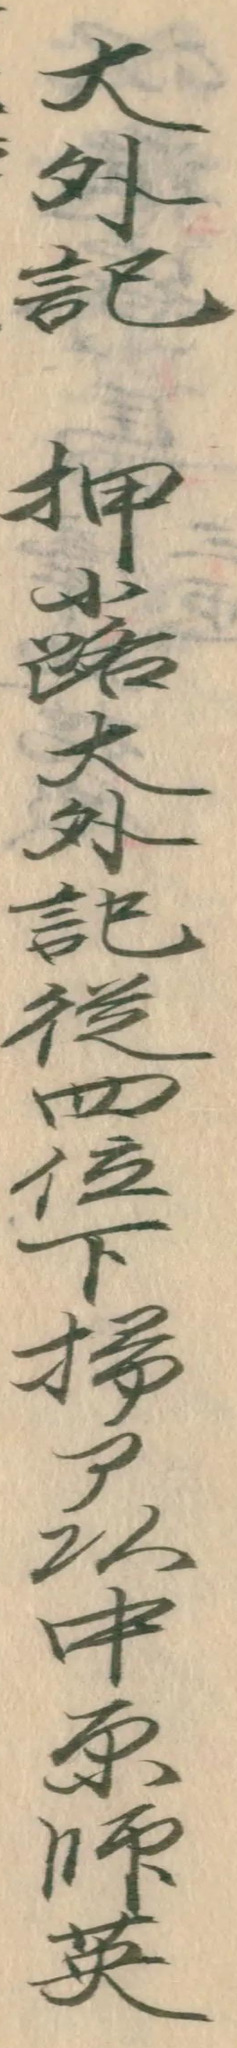大外記押小路大外記従四位下掃部頭中原師英
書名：賀茂社記録. 第16冊
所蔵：国立国会図書館 National Diet Library, JAPAN
